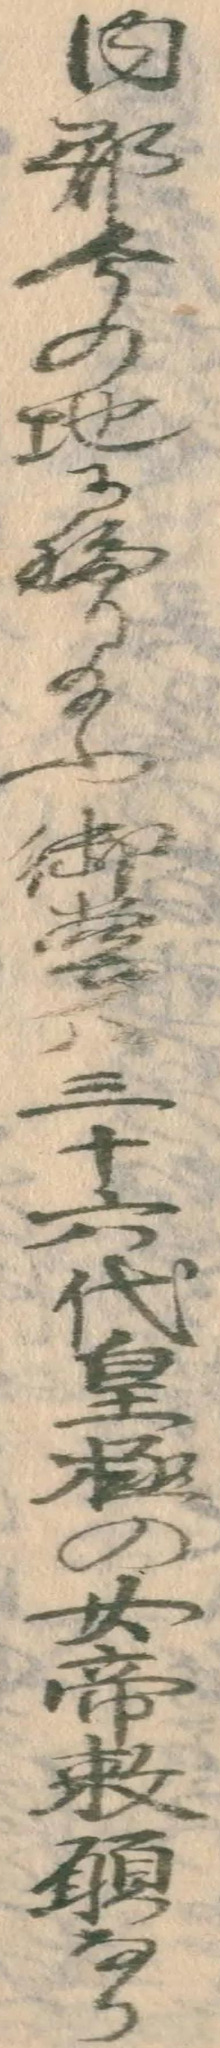内郡今の地に移り給ふ御当代ハ三十六代皇極の女帝勅願なり
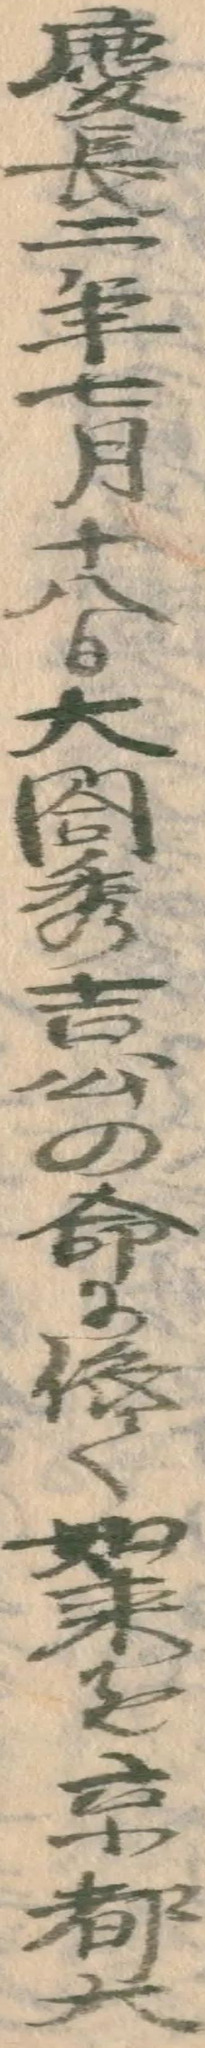慶長二年七月十八日太閤秀吉の命に依て如来を京都大
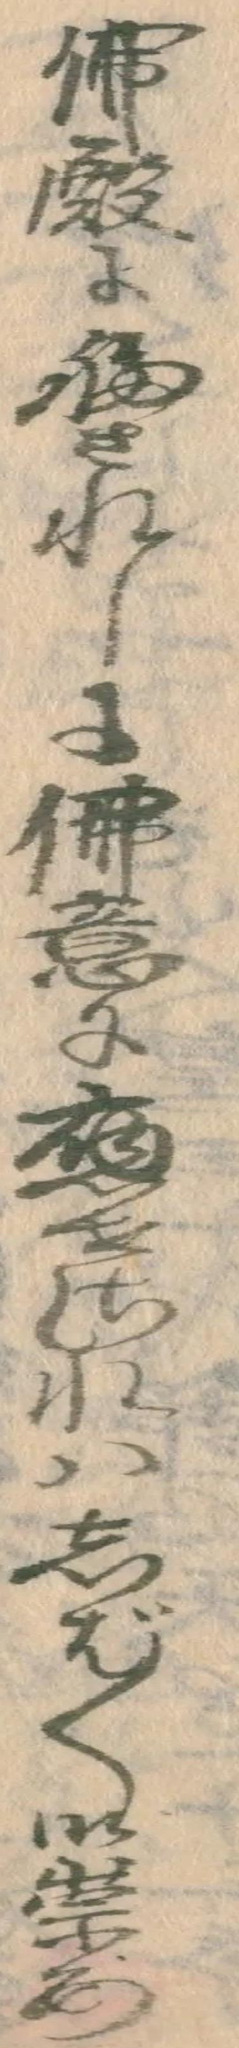仏殿に移されしに仏意に応さすれハしばしば御崇敬
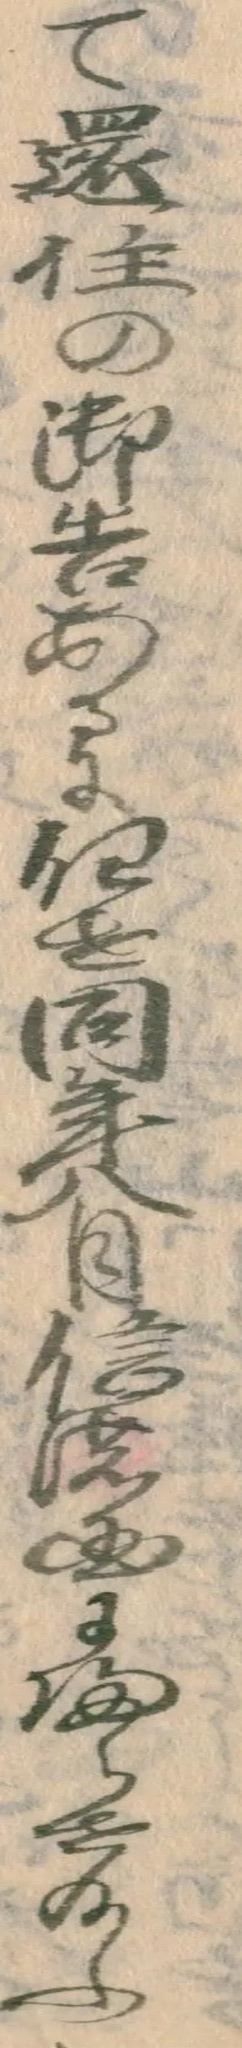て還住の御告あるに任せ同年八月信濃国に帰らせ給ふ
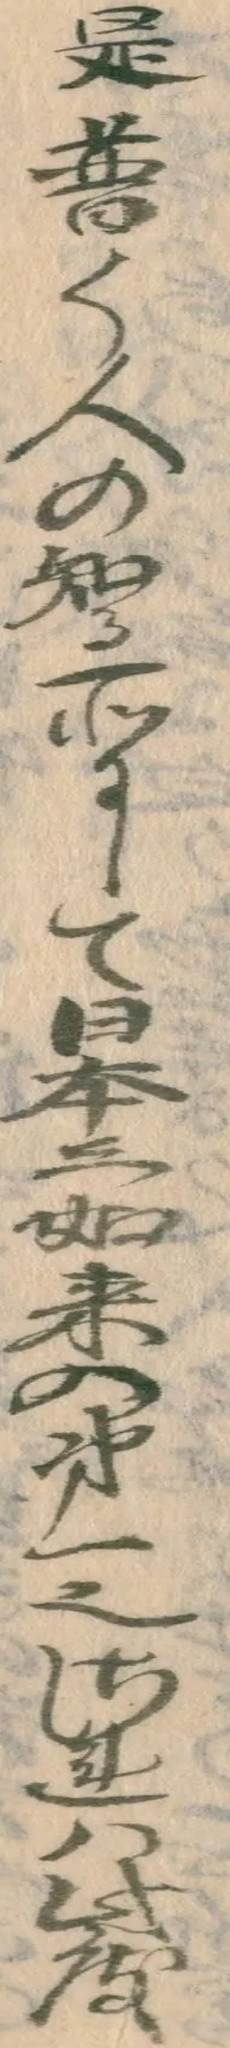是普く人の知る所にて日本三如来の第一也御れハ此度
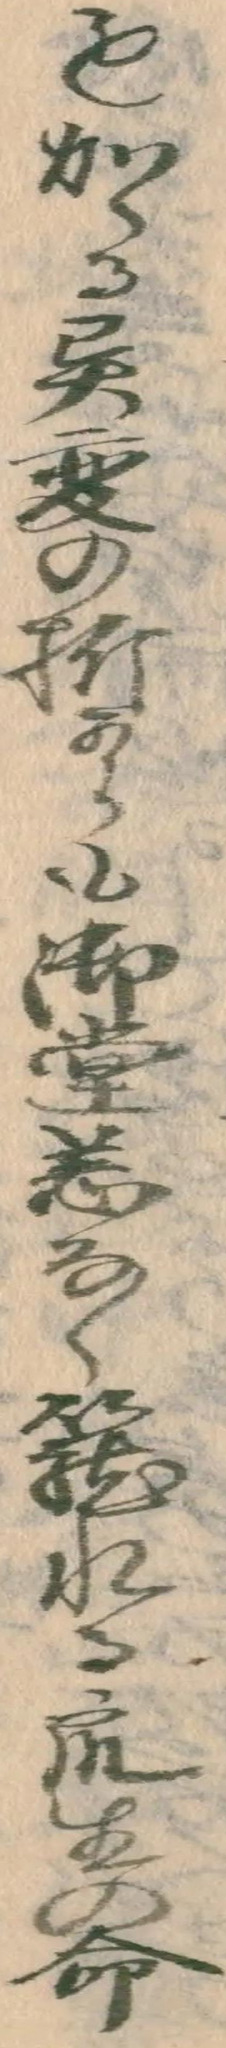もかゝる異変の折からも御堂恙なく籠れる衆生の命
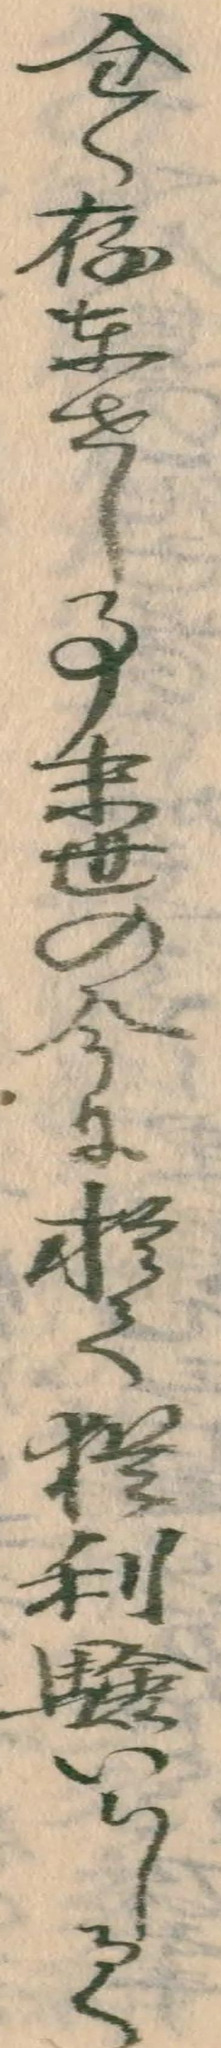全く存在せし事末世の今に於て猶利験いたりて
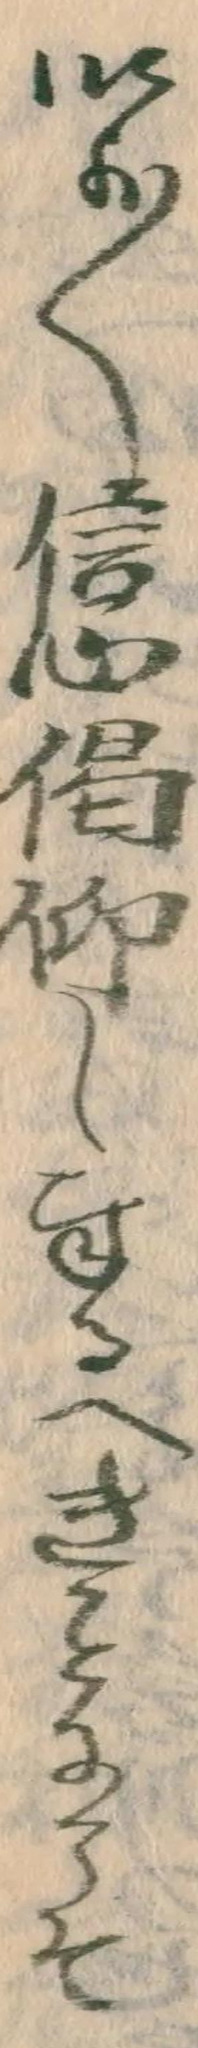いよいよ信心偈仰し奉るへきことにこそ
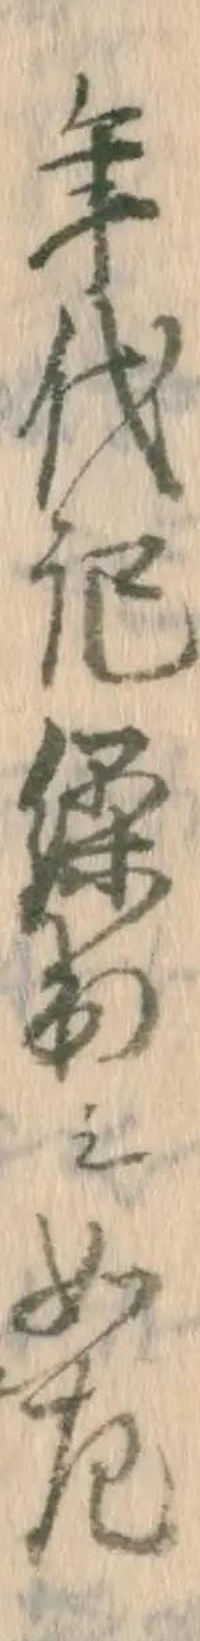年代記條出シ如左
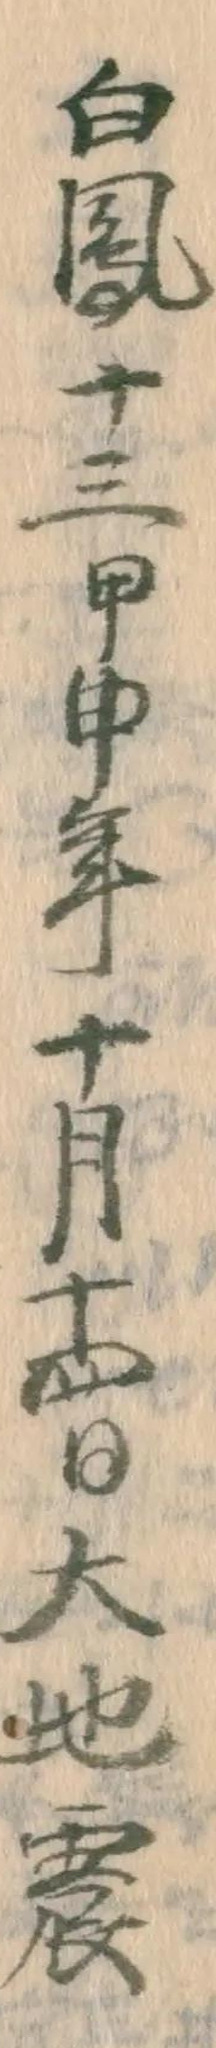白鳳十三甲申年十月十四日大地震
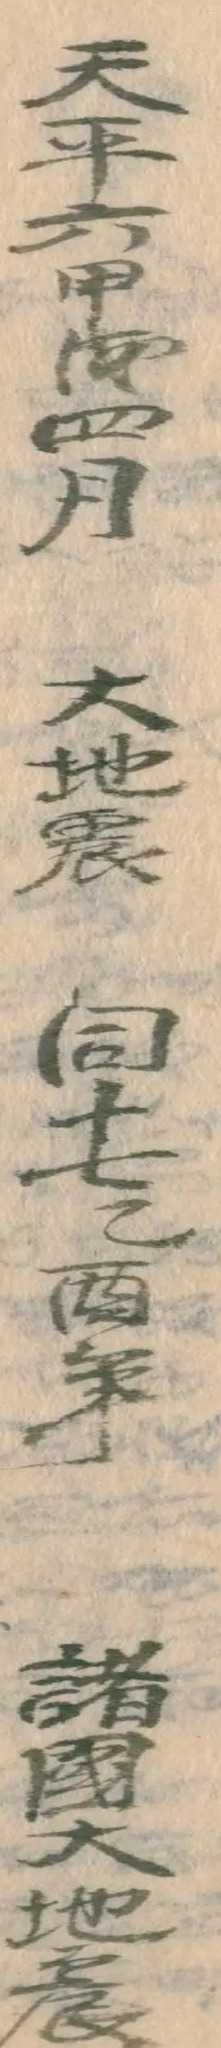天平六甲戌四月同十七乙酉年諸国大地震
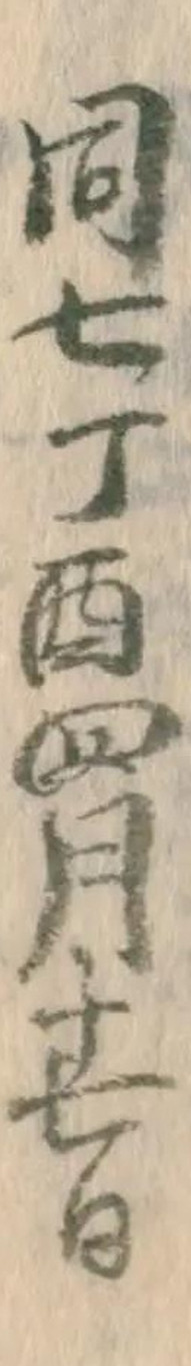同七丁酉四月十七日同

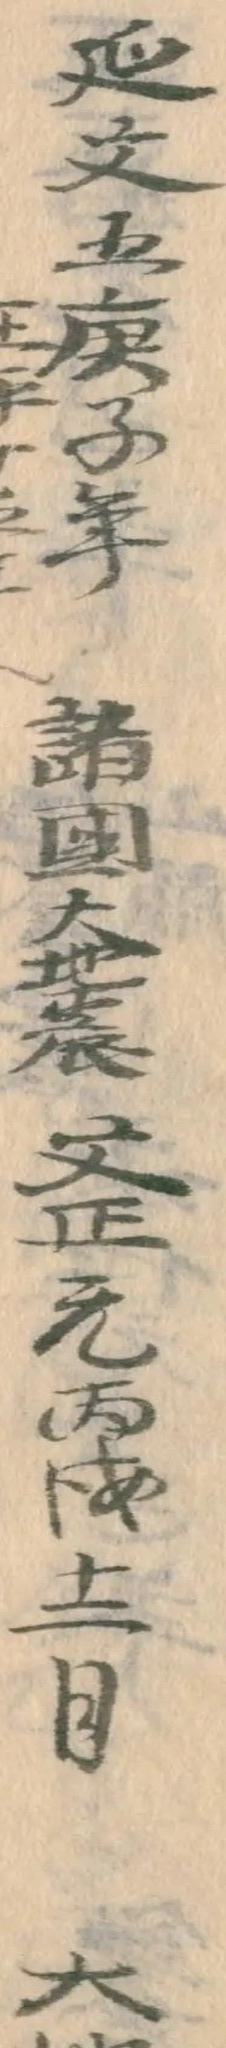延文五癸子年諸国大地震文正元酉戌十二月大地震
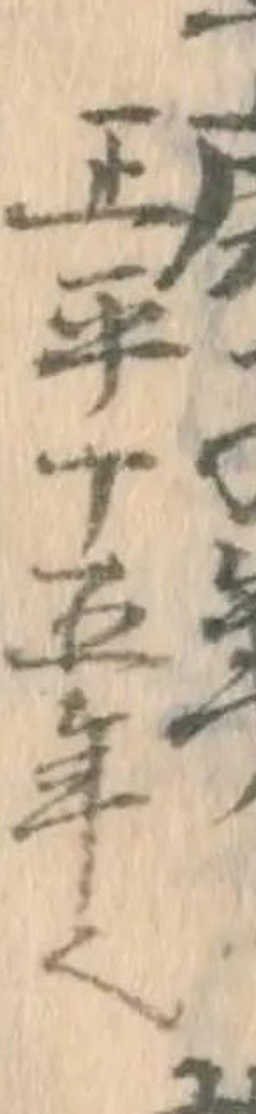正平十五年也
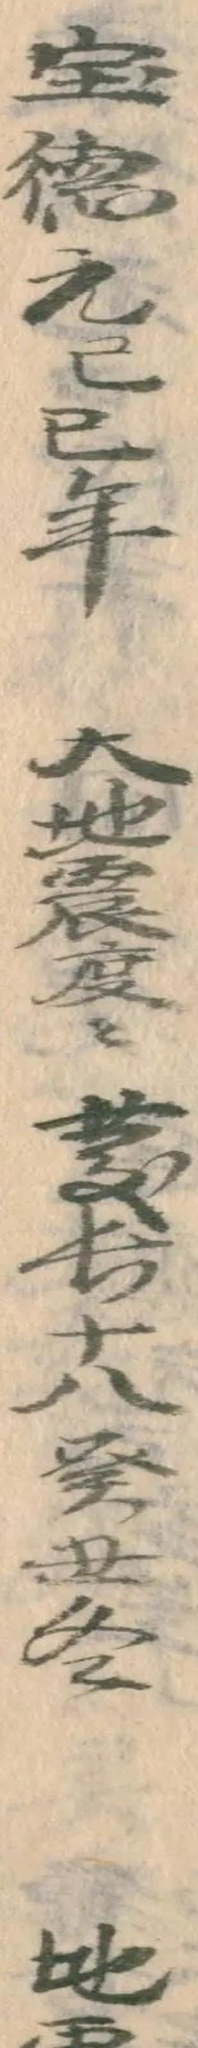宝徳元己巳年大地震度々慶長十癸丑八年地震
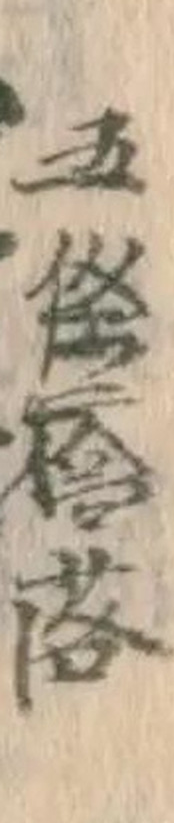五條橋落
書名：信州大地震之記
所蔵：国立国会図書館 National Diet Library, JAPAN
